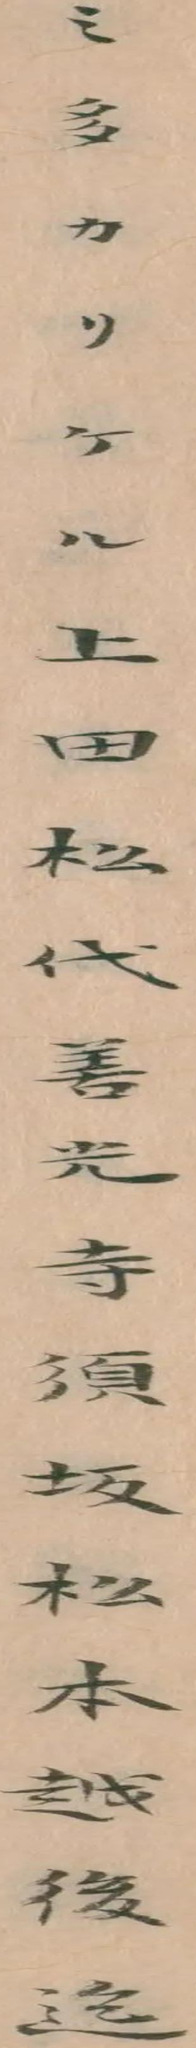ミ多カリケル上田松代善光寺須坂松本越後迄
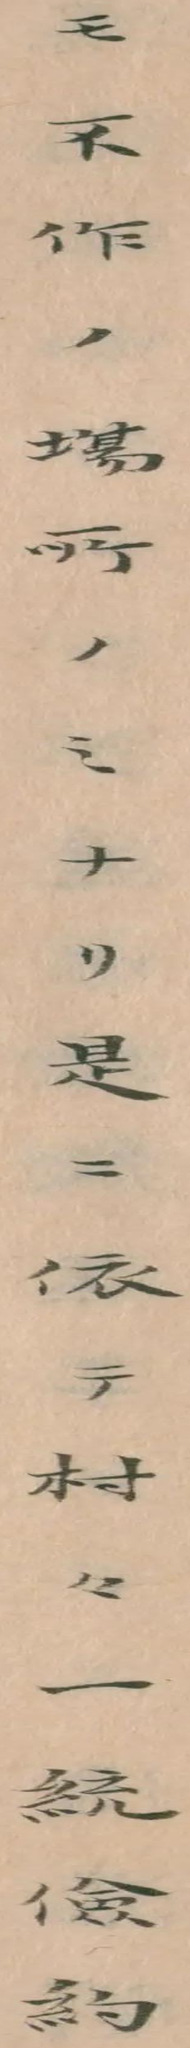モ不作ノ場所ノミナリ是二依テ村々一統倹約
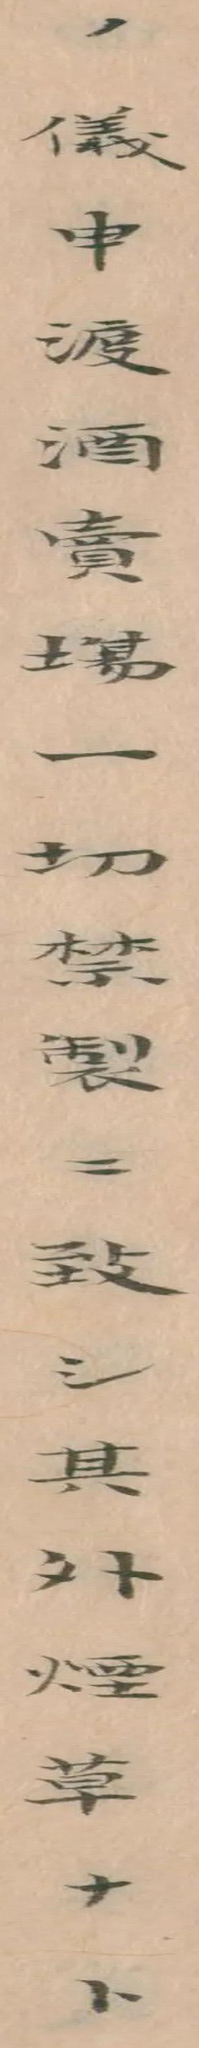ノ儀申渡酒売場一切禁製二致シ其外煙草ナト
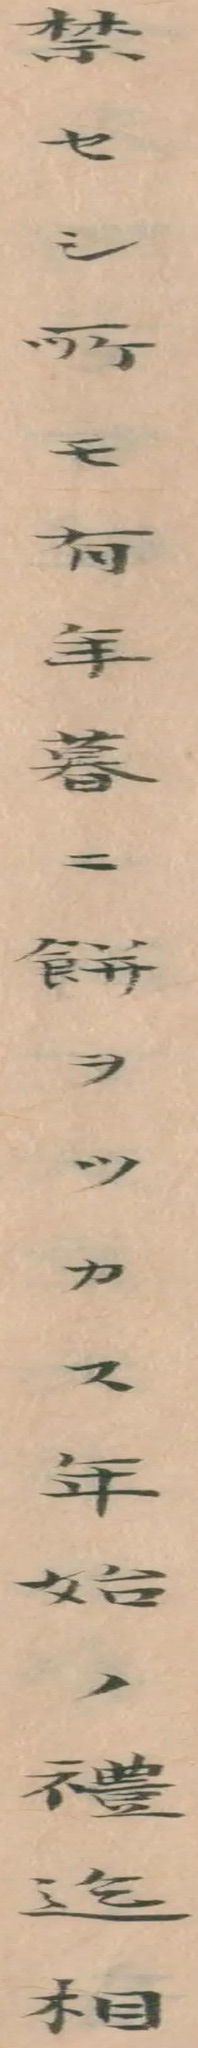禁セシ所モ有年暮二餅ヲツカス年始ノ礼迄相

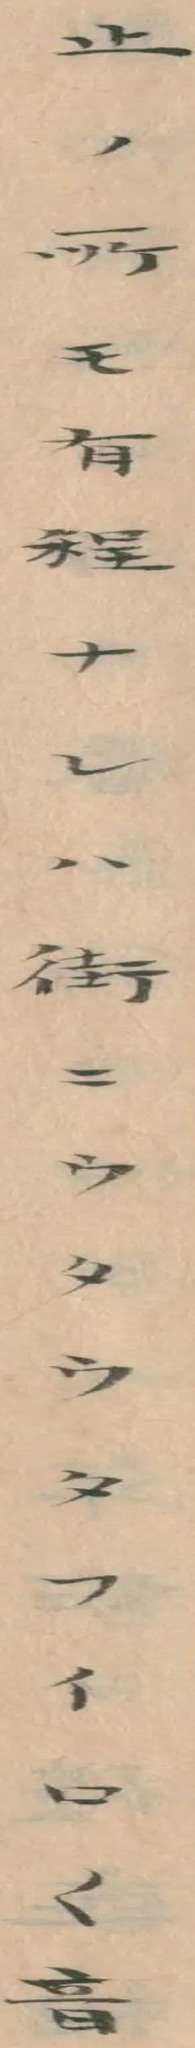止ノ所モ有程ナレハ街二ウタウタフイロ〳〵音
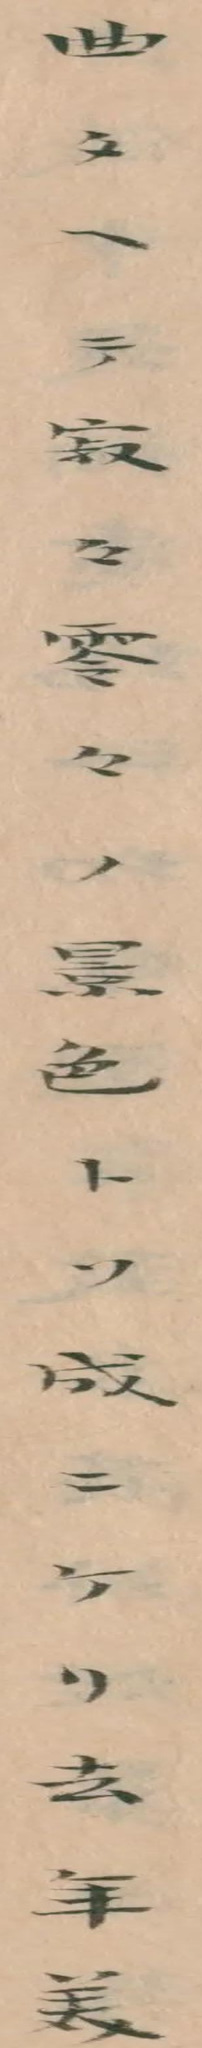曲タヘテ寂々零々ノ景色トソ成二ケリ去年美
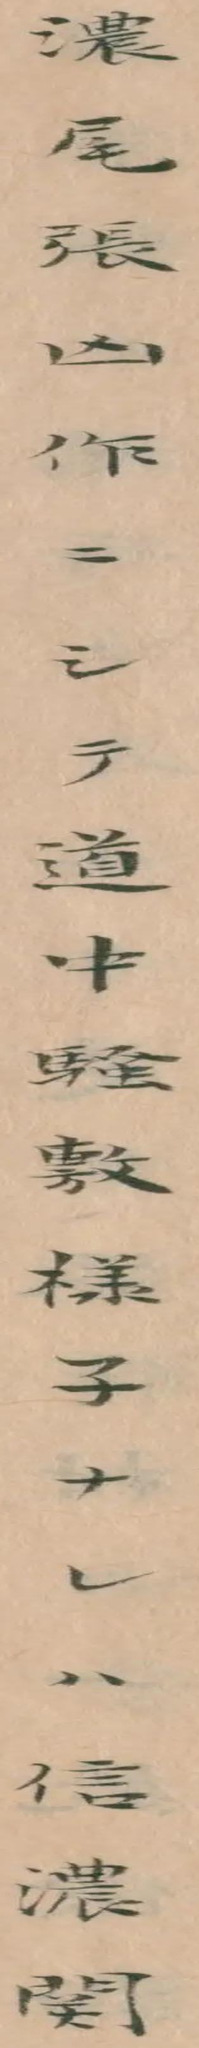濃尾張凶作二シテ道中騒敷様子ナレハ信濃関
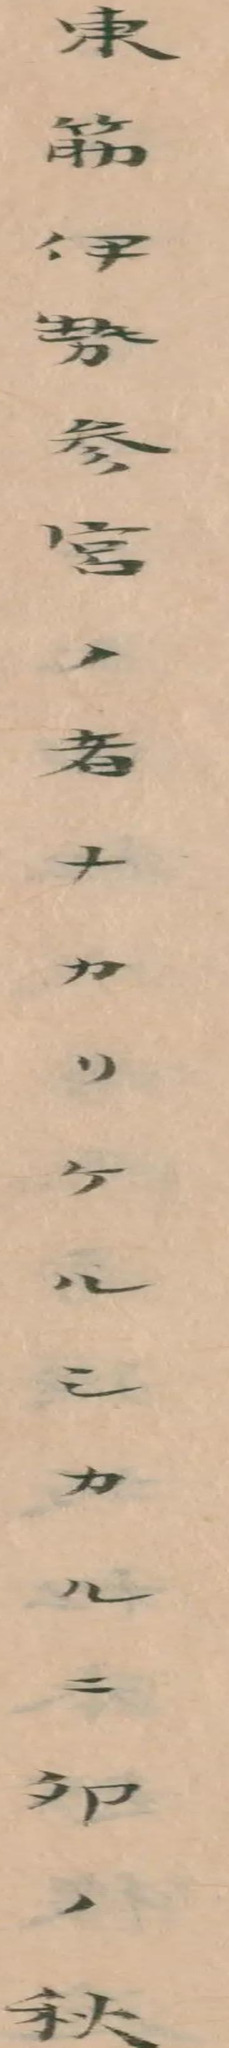東筋伊勢参宮ノ者ナカリケルシカルニ卯ノ秋
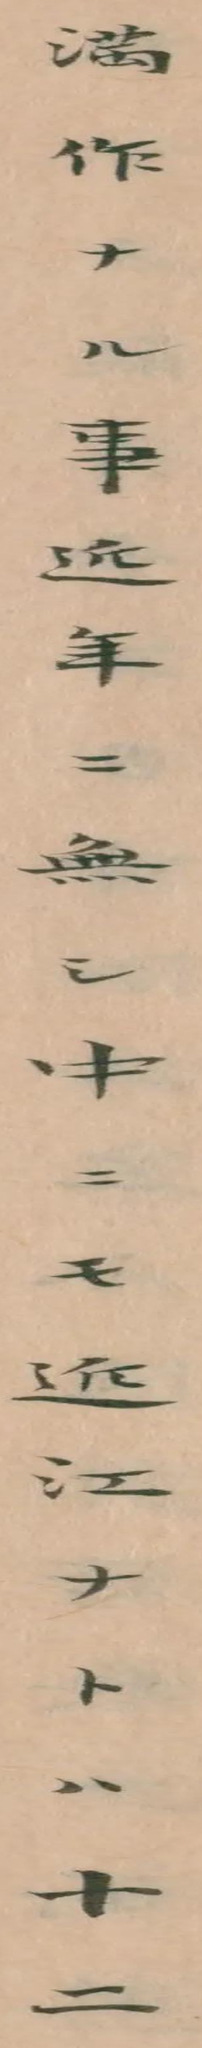満作ナル事近年二無シ中二モ近江ナトハ十二
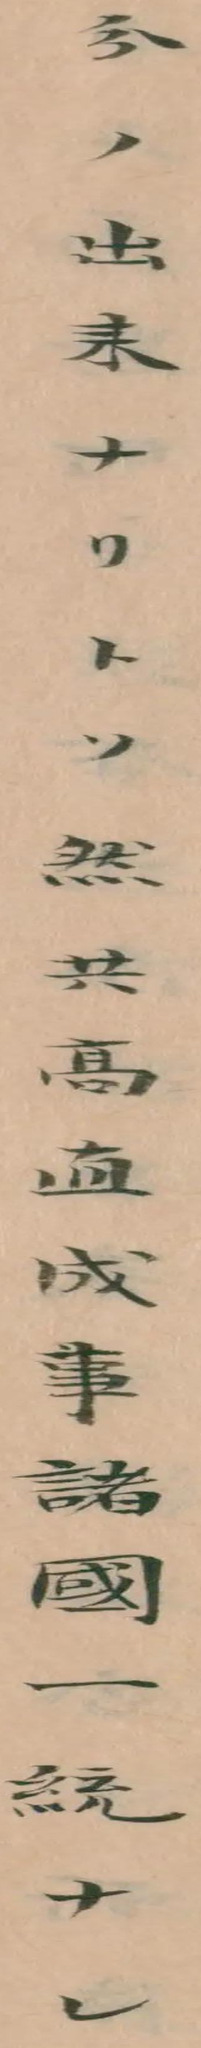分ノ出来ナリトソ然共高直成事諸国一統ナレ
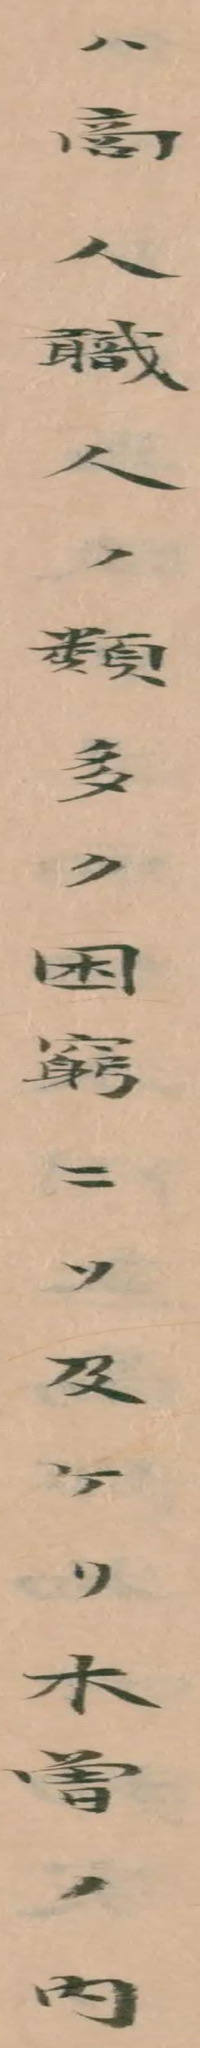ハ商人職人ノ類多ク困窮二ソ及ケリ木曽ノ内
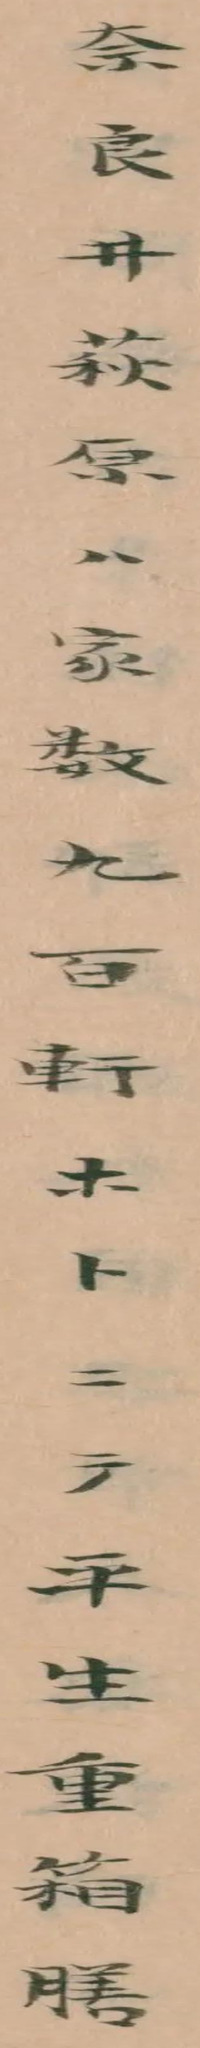奈良井萩原ハ家数九百軒ホト二テ平生重箱膳
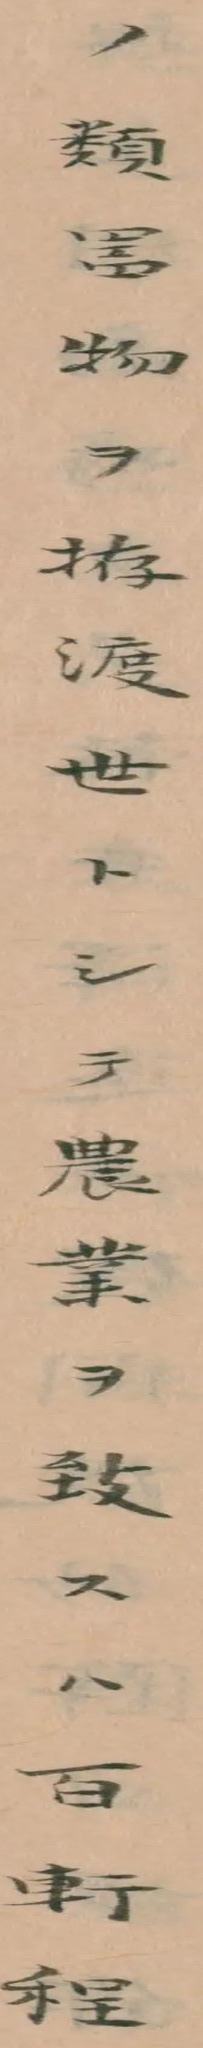ノ類器物ヲ拵渡世トシテ農業ヲ致スハ百軒程
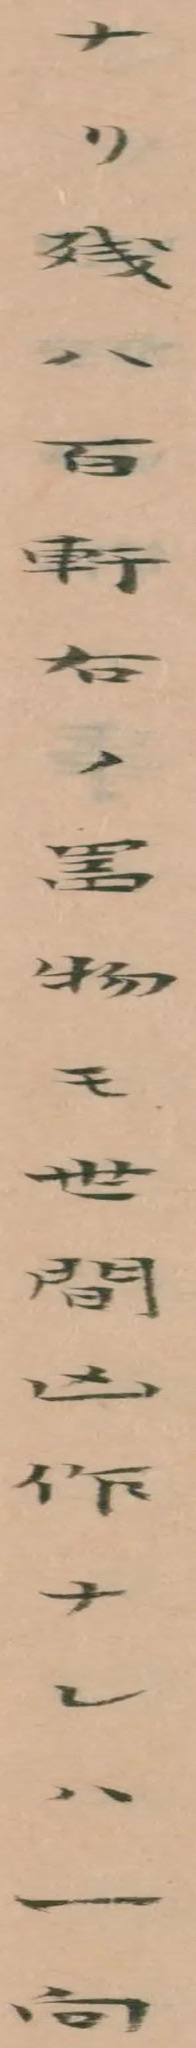ナリ残ハ百軒右ノ器物モ世間凶作ナレハ一向
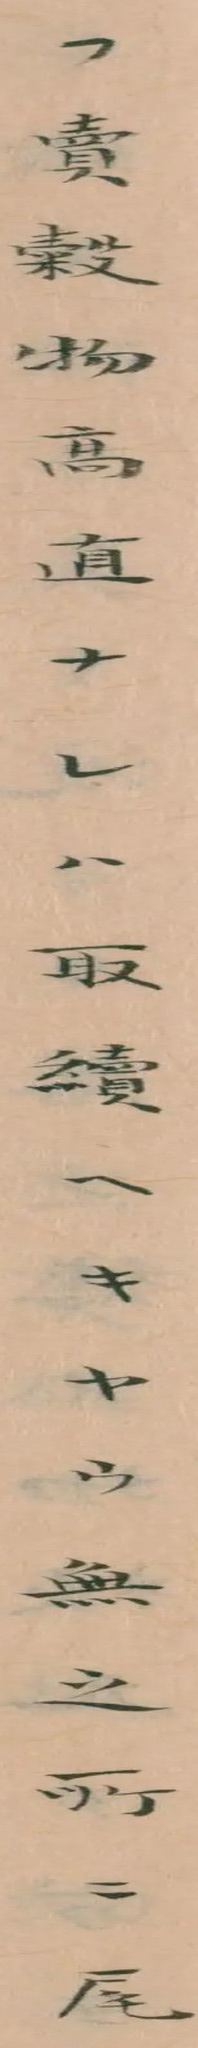ヲ売穀物高直ナレハ取続ヘキヤウ無之所二尾
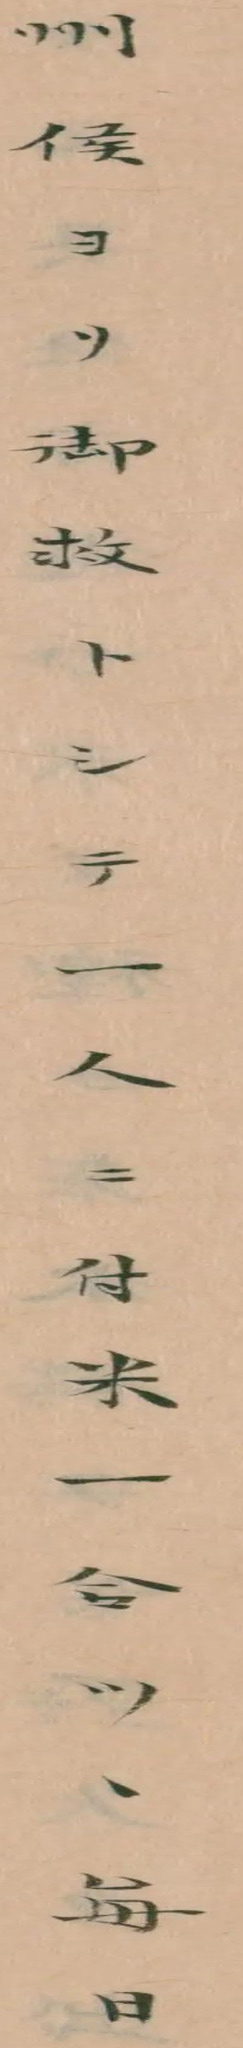州侯ヨリ御救トシテ一人二付米一合ツゝ毎日
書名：地災撮要. 巻3(地震之部)-巻4(噴火之部)
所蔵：国立国会図書館 National Diet Library, JAPAN
